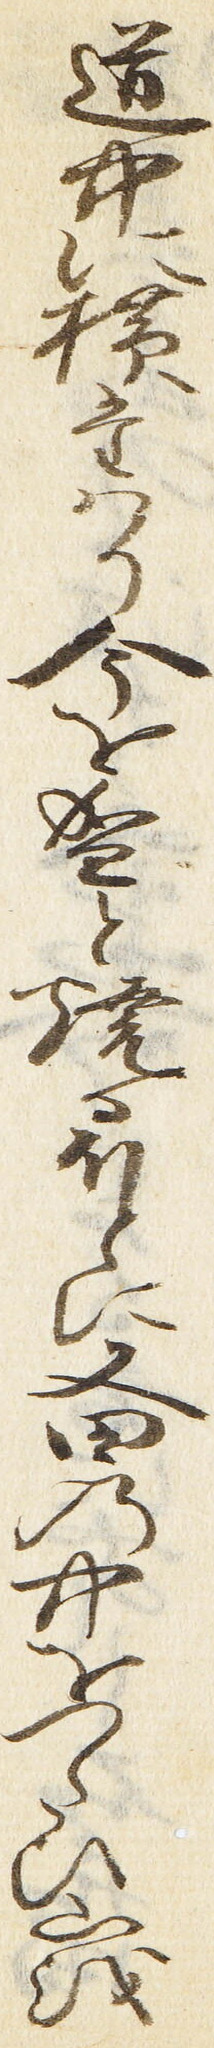道中に横たはり今を盛と焼るほとに又田の中をつたひ山を
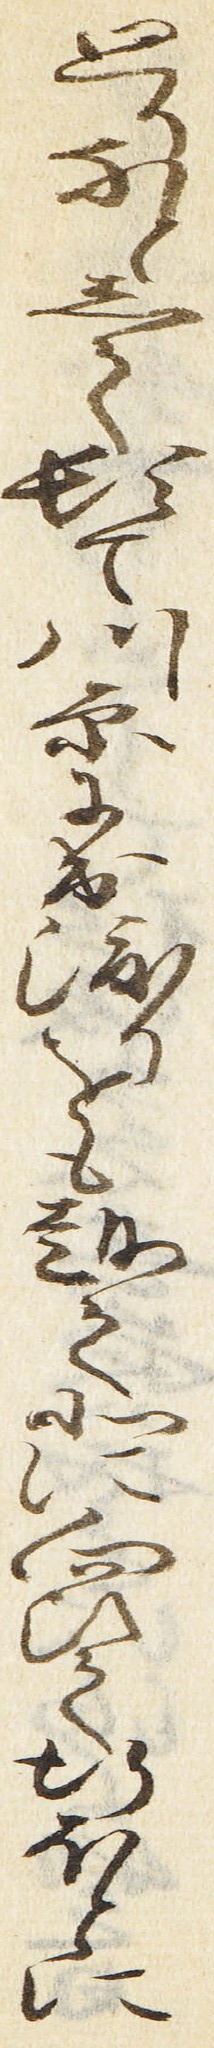廻りなとして頓て河原に出渡りをも越て北に向ひて行ほとに
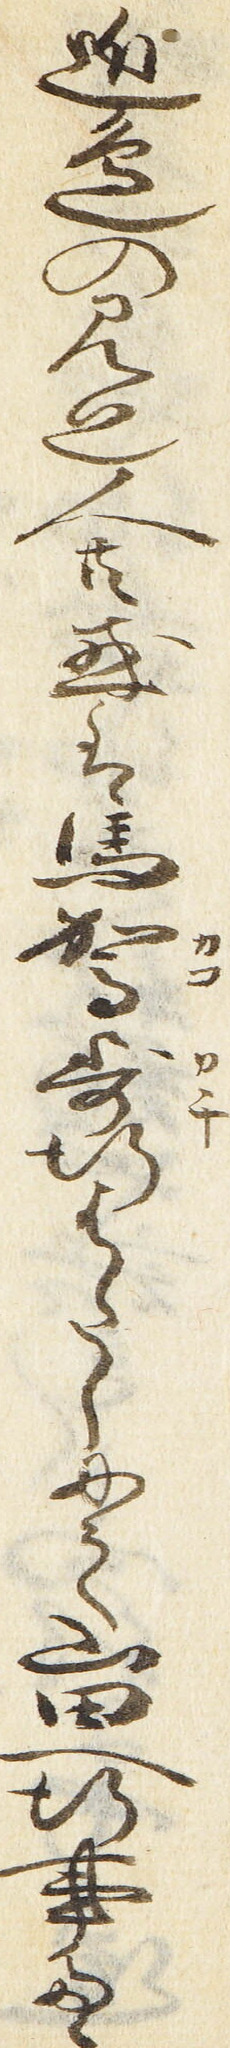近辺の見廻人共或は馬駕歩行はたしにて山田へ行事多々
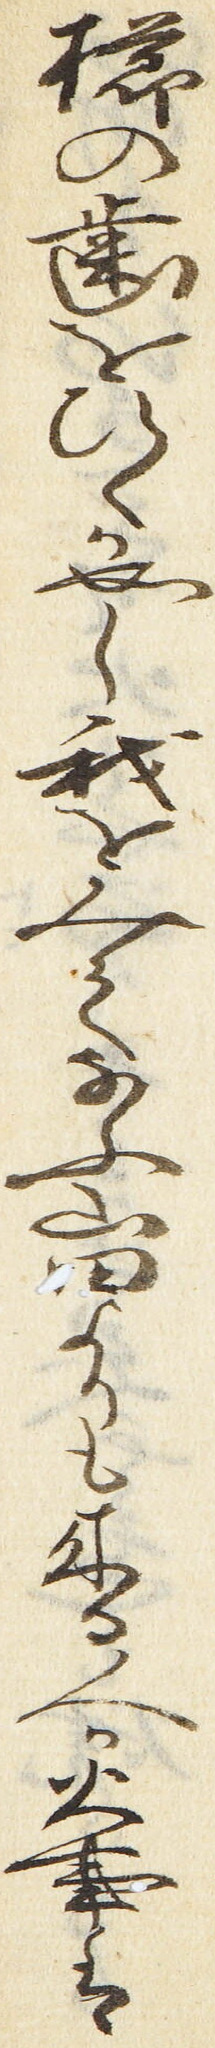櫛の歯をひくか如し我をみてなふ山田よりも来る人か火事は

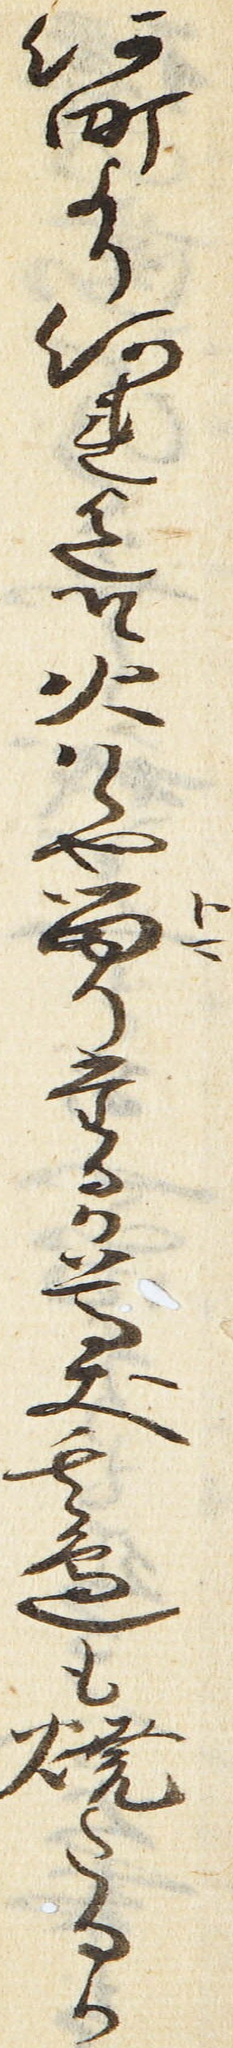何町より何れ迄そ火ははや留りたるか其辺も焼たるか
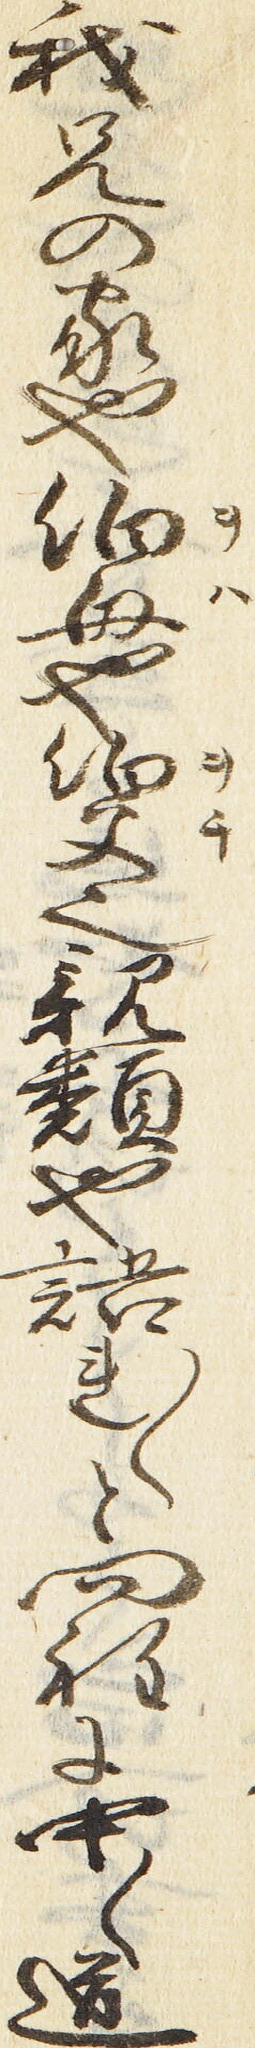我兄の家や伯母や伯父也親類や語れ〳〵と問程に中〳〵道
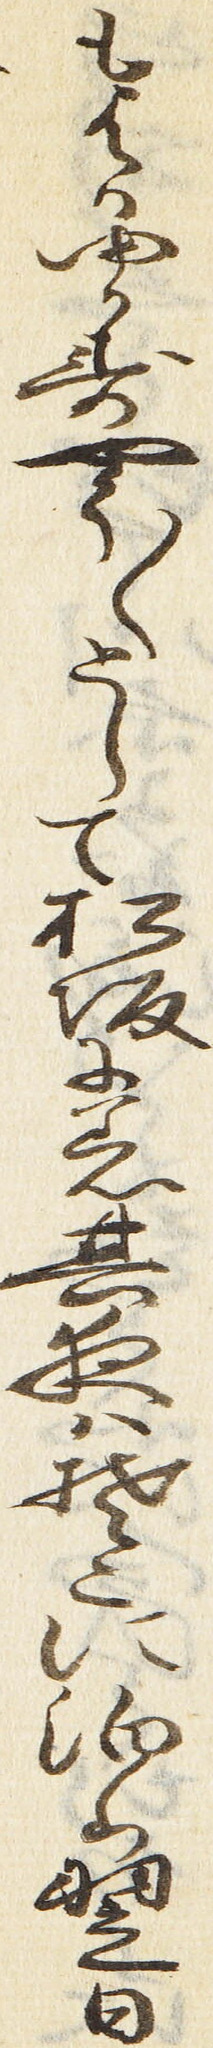もはかゆかすやう〳〵として松坂に着其夜はそこに泊り翌日
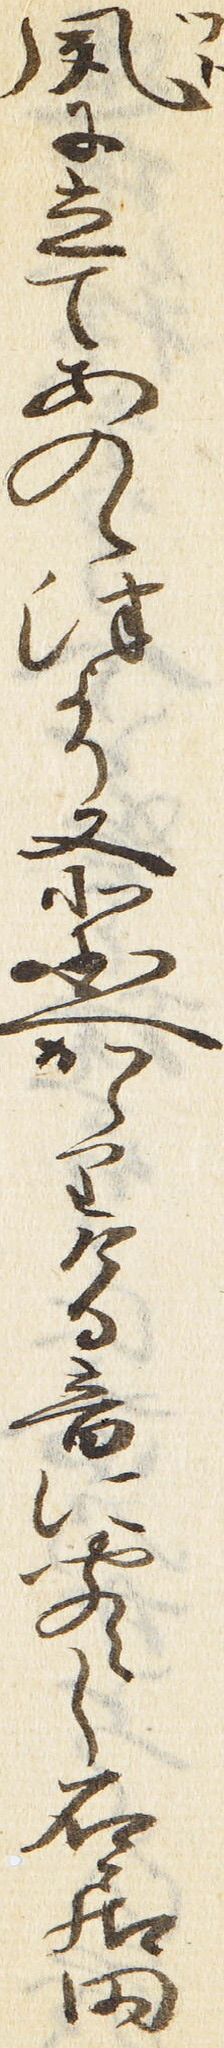夙に立てあのゝ津より又北国へかゝりける音に聞えし石居田
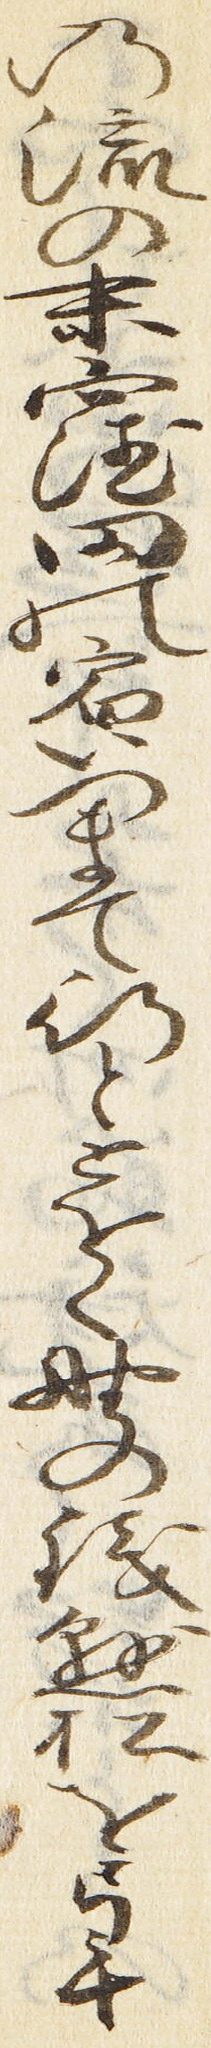の流の末窪田の宿いつまて行ととをく野の銭懸松を弓手
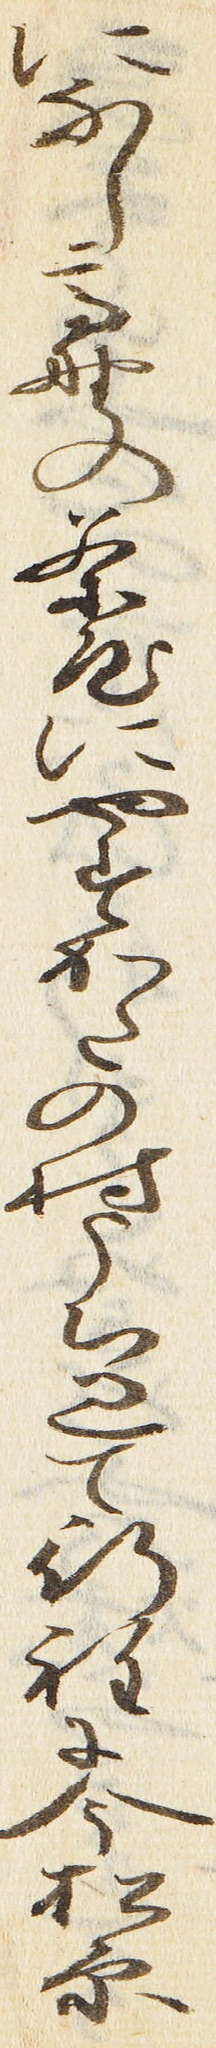になし高野の茶屋にやすかたの村うち廻て行程に今松原
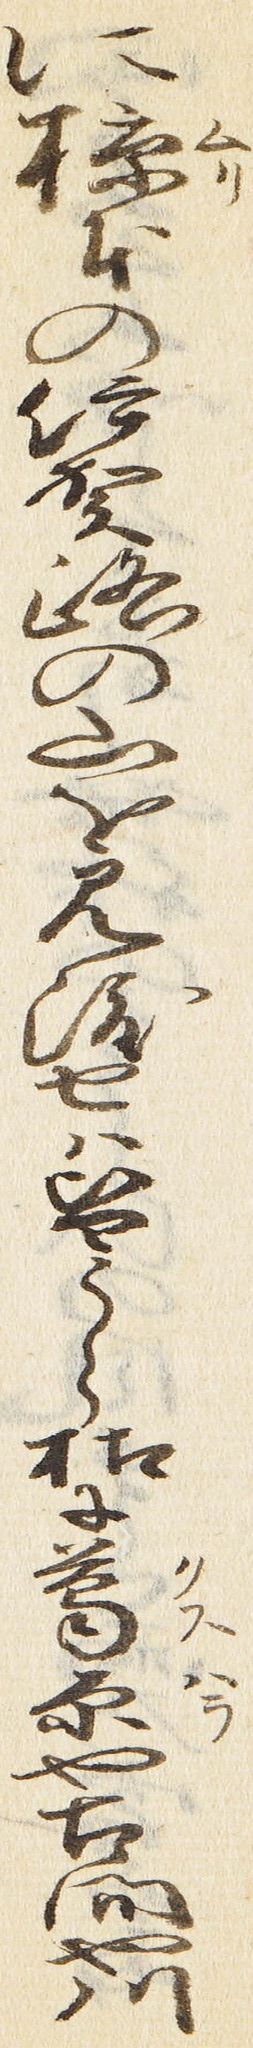に椋本の伊賀路の山を見渡せは皆うら枯に葛原や古間や川
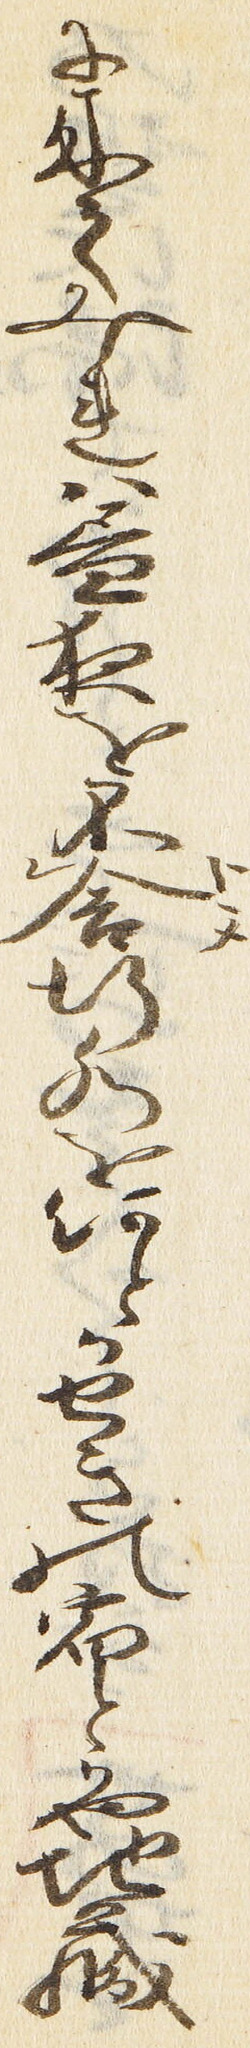に来てみれは昼夜を不舎行水を何とかせきの宿とかや地蔵
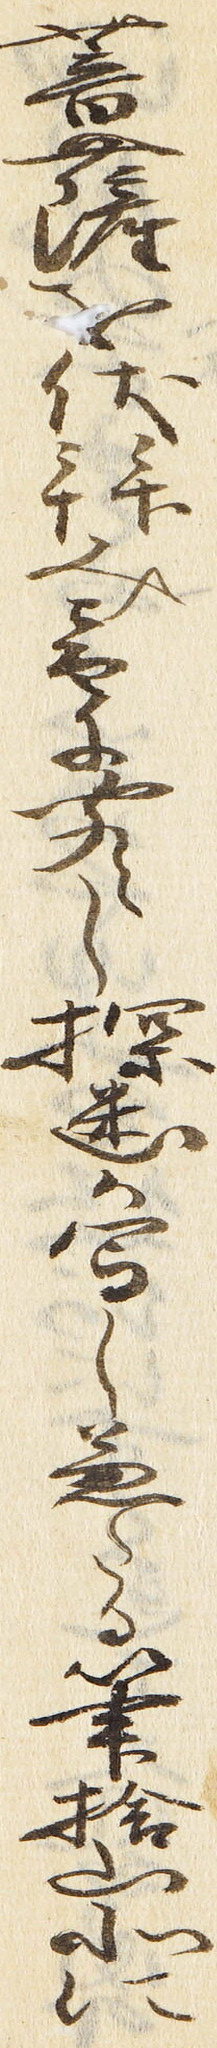菩薩を伏拝み音に聞えし探幽か写し兼たる筆捨山北に
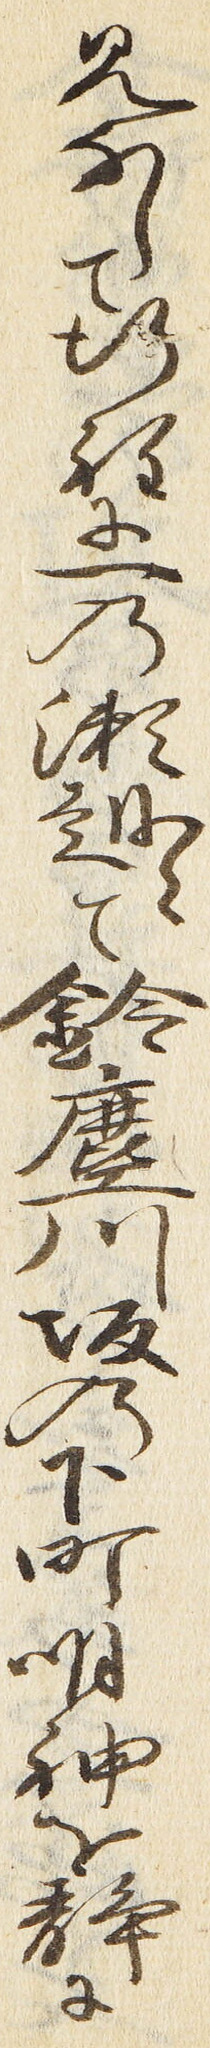見なして行程に一の瀬越て鈴塵川坂の下町明神を静に
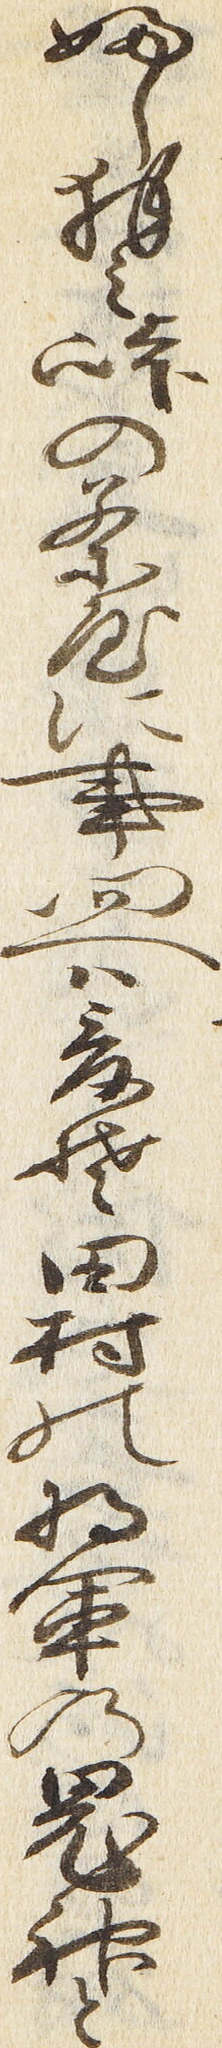ふし拝み峠の茶屋に事問へは爰そ田村の将軍の鬼神と
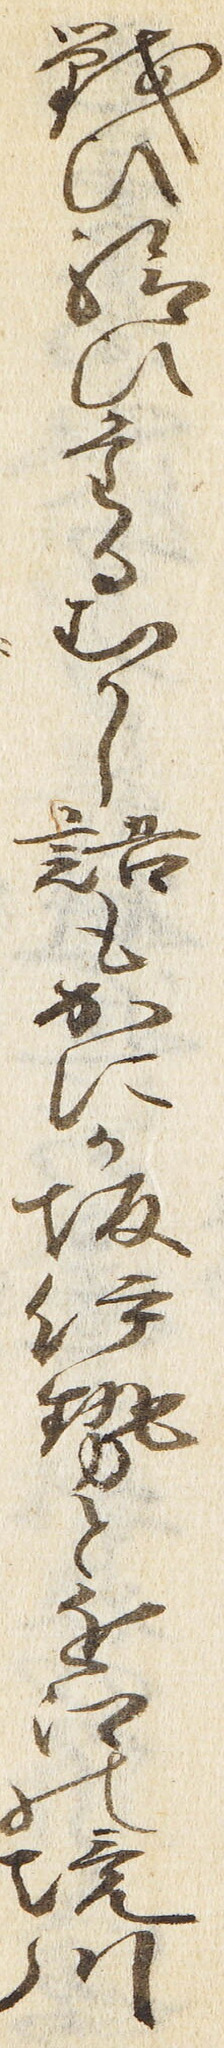戦ひ給ひたるむかし語もかにか坂伊勢と近江の境川
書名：海陸世話日記
